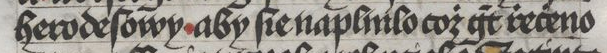herodeſowy.aby ſie naplinilo coż ḡt ṙeċeno
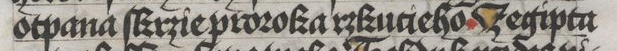otpana ſkrzie proroka rzkucieho.Zegipta
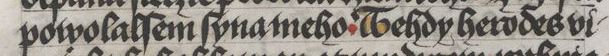powolal ſem ſyna meho.Tehdy herodes ui¬
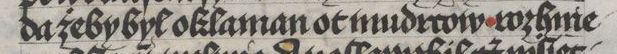da żeby byl oklaman ot mudrcow.rozhnie¬
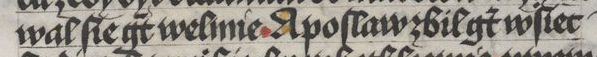wal ſie ḡt welmie.A poſlaw zbil ḡt wẛiec¬
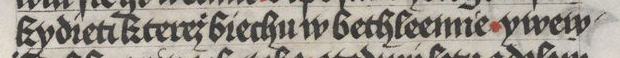ky dieti ktereż biechu w bethleemie.ywew¬
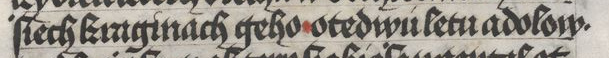ẛiech kraginach geho.otedwú letu a dolow.
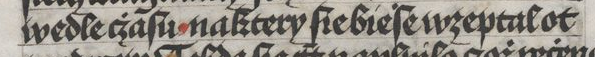wedle cżaſu.naktery ſie bíeẛe wzeptal ot
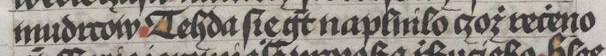mudrcow.Tehda ſie ḡt naplnilo czoż ṙeċeno
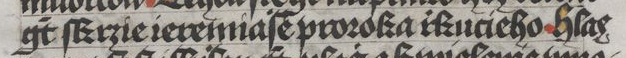ḡt ſkrze ieremiaẛe proroka ṙkucieho.Hlas
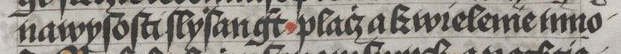na wyſoſti ſlyẛan ḡt.plaċz a kwíelenie mno¬
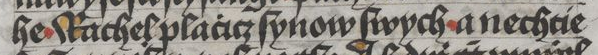he.Rachel plaċicz ſynow ſwych.a nechtie¬
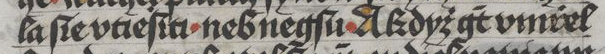la ſie vtieẛiti.neb negſu.A kdyż ḡt vmṙel
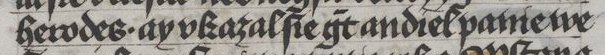herodes.ay vkazalſie ḡt andiel panie we
